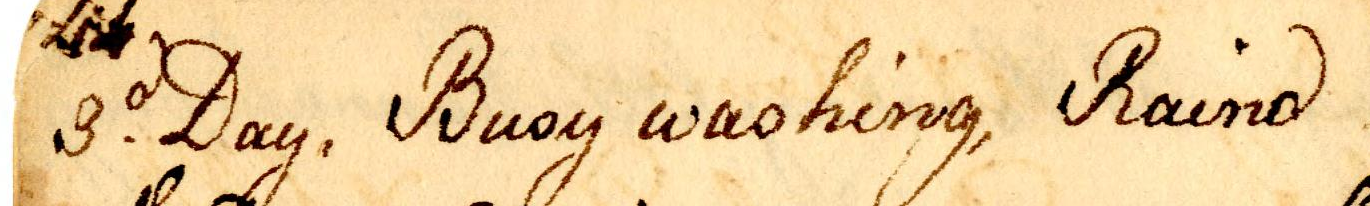3^d. Day, Busy washing, Raind
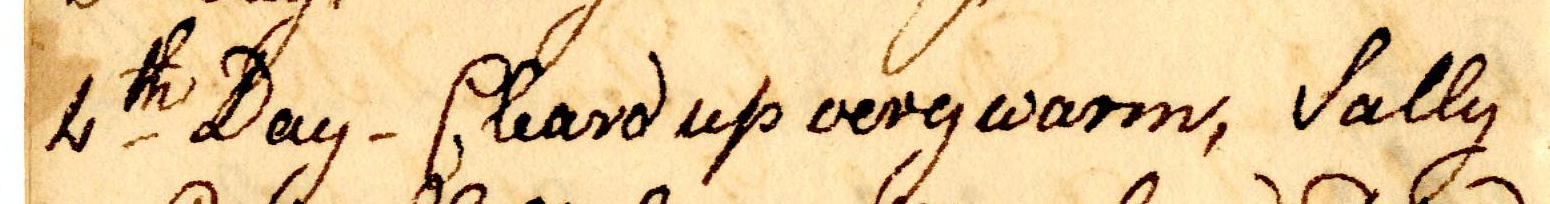4^th Day- Cleard up very warm, Sally
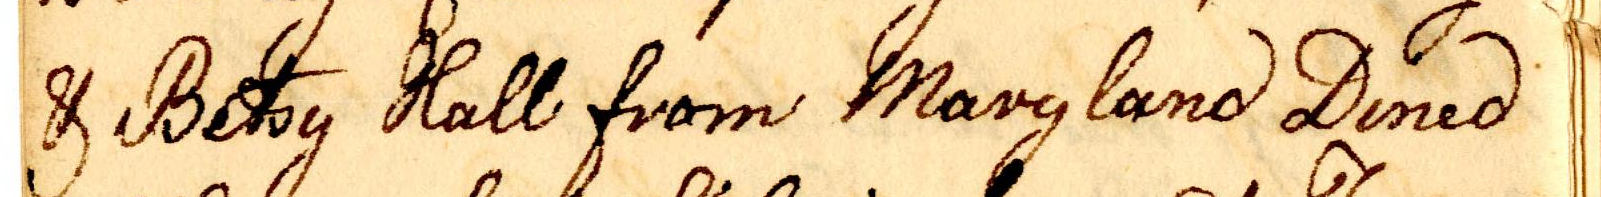& Betsy Hall from Maryland Dined
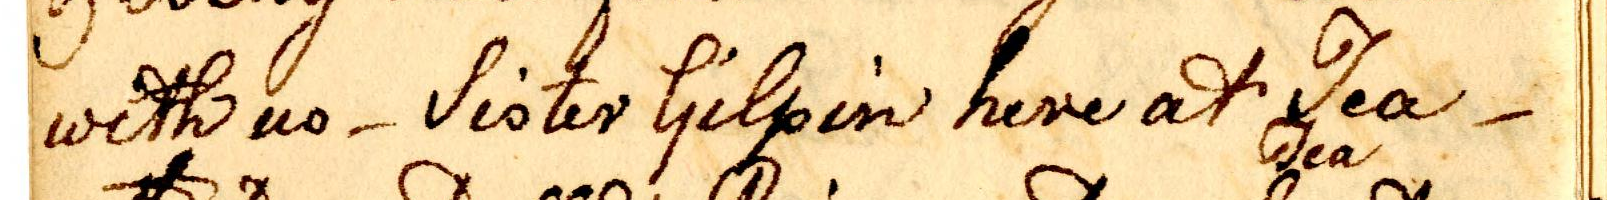with us- Sister Gilpin here at Tea-
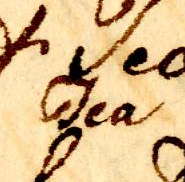Tea
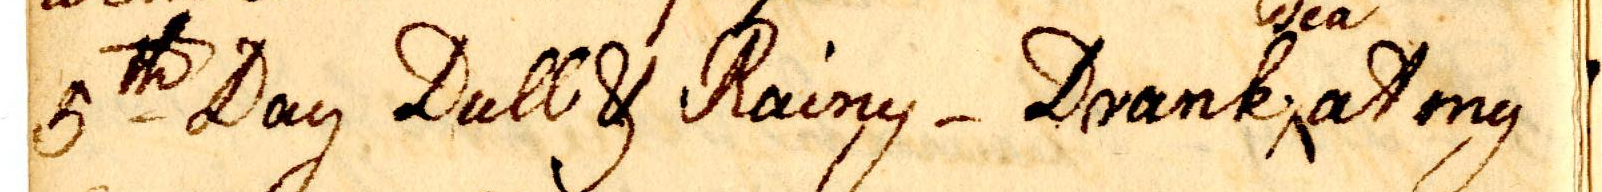5^th Day Dull & Rainy- Drank ^ at my
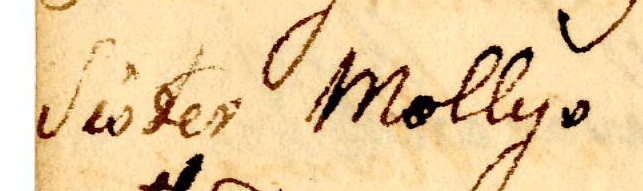Sister Mollys
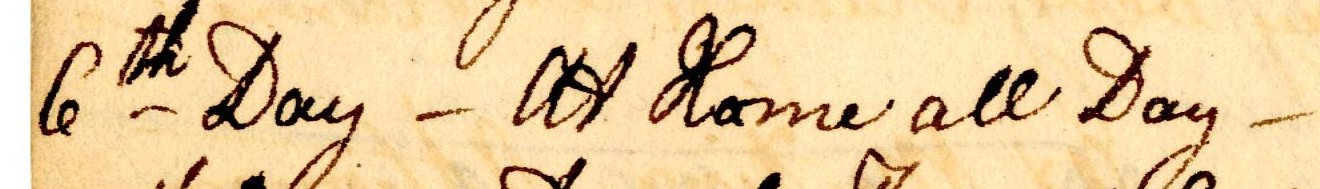6^th Day- At Home all Day-
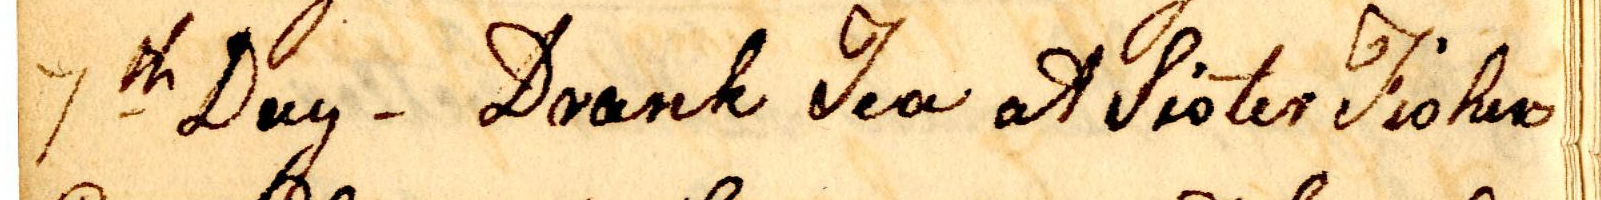7^th Day- Drank Tea at Sister Fishers
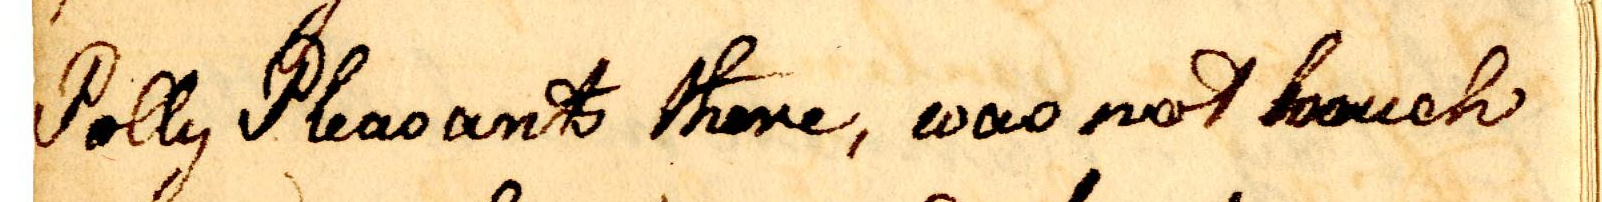Polly Pleasants there, was not much
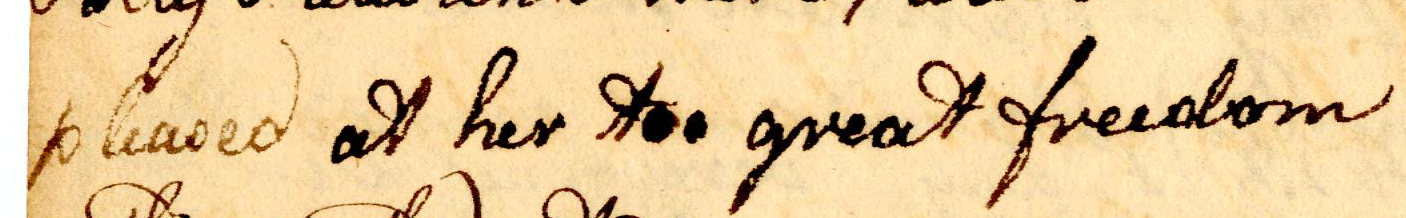pleased at her too great freedom
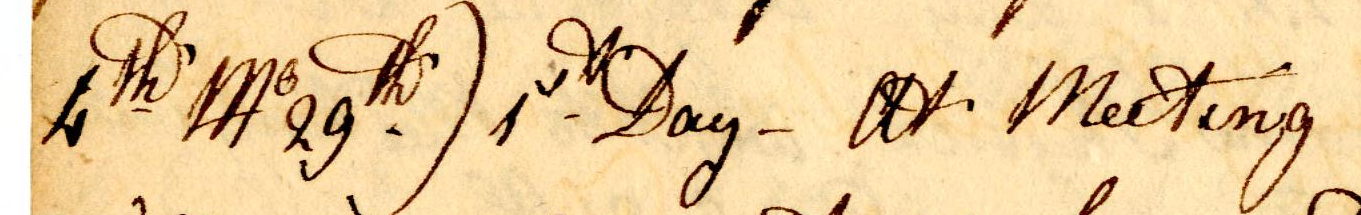4^th M^o 29^th) 1^st Day- At Meeting
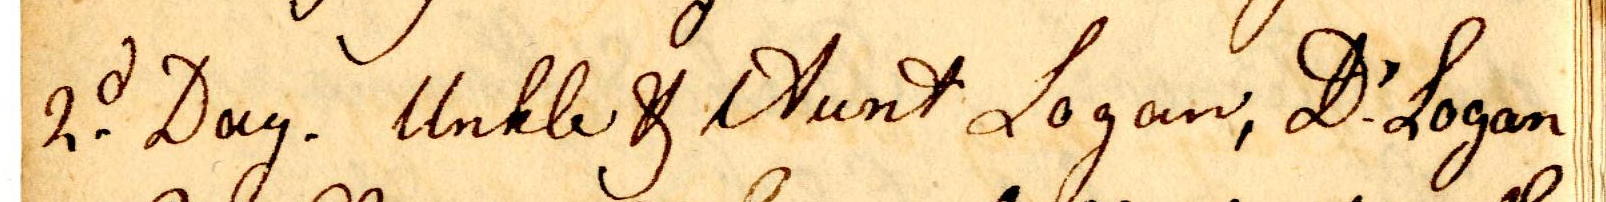2^d. Day. Unkle & Aunt Logan, D^r. Logan
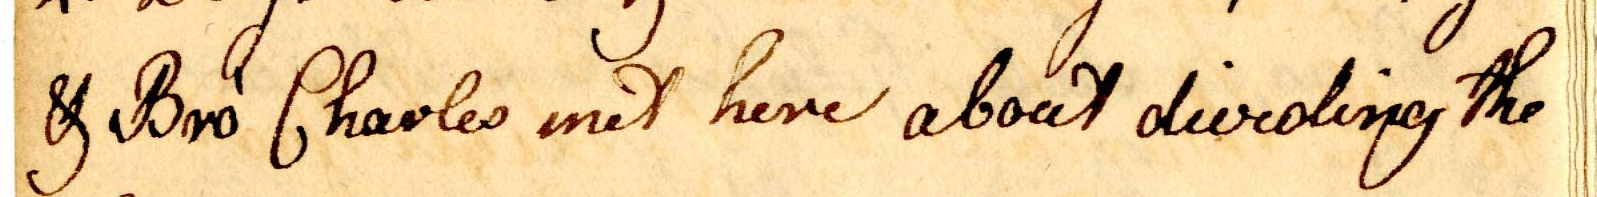& Bro' Charles met here about dividing the
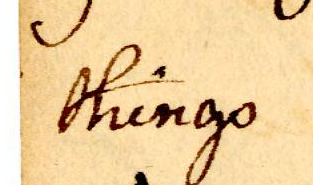things
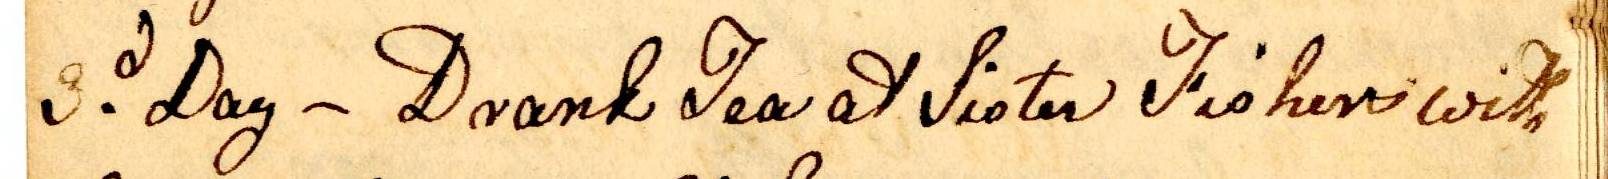3^d. Day- Drank Tea at Sister Fishers with
